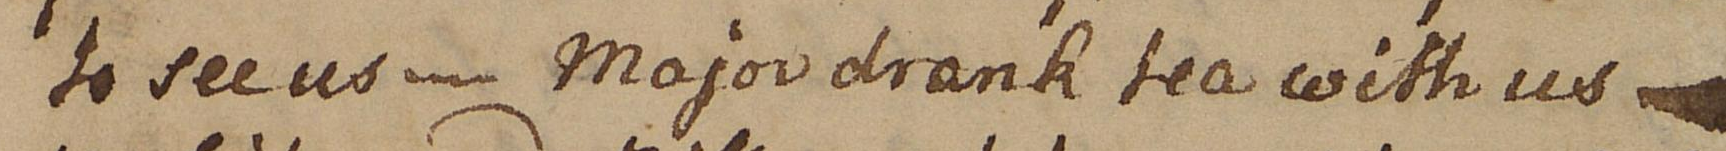to see us- Major drank tea with us-
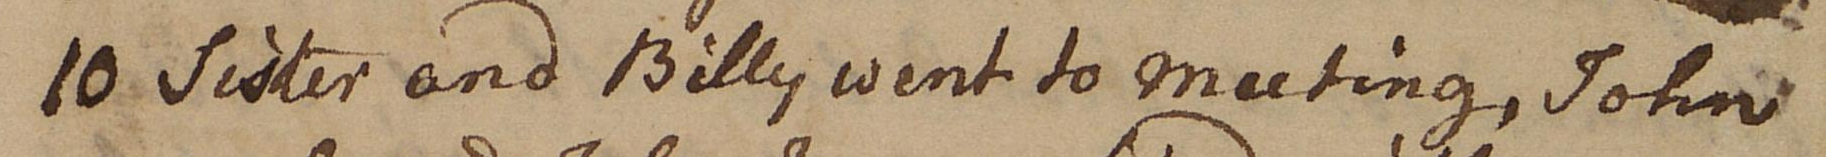10 Sister and Billy went to meeting, John
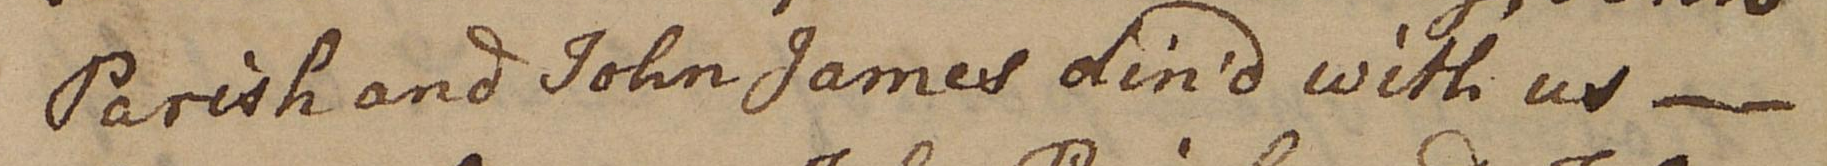Parish and John James din'd with us-
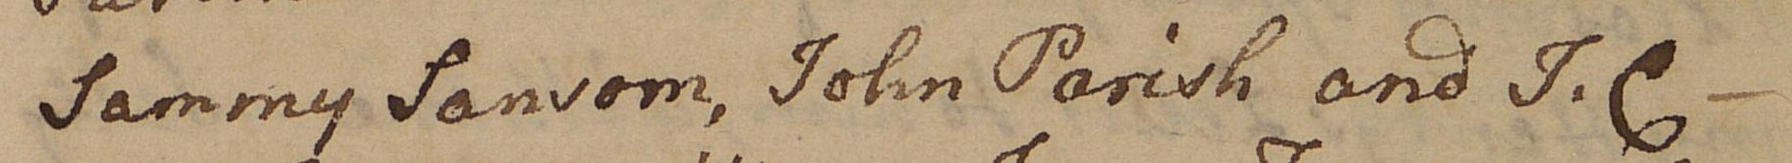Sammy Sansom, John Parish and T.C-
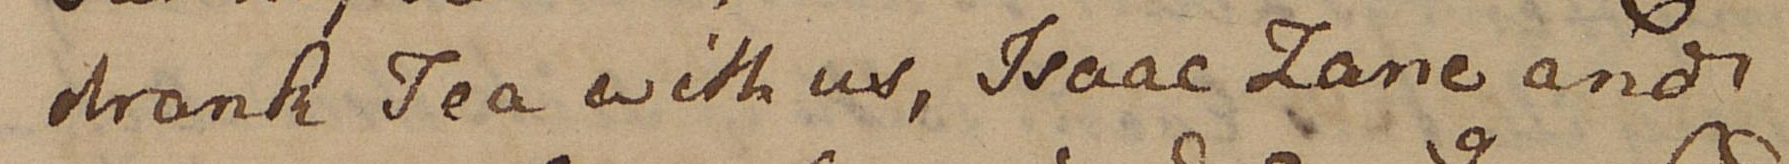drank Tea with us, Isaac Zane and
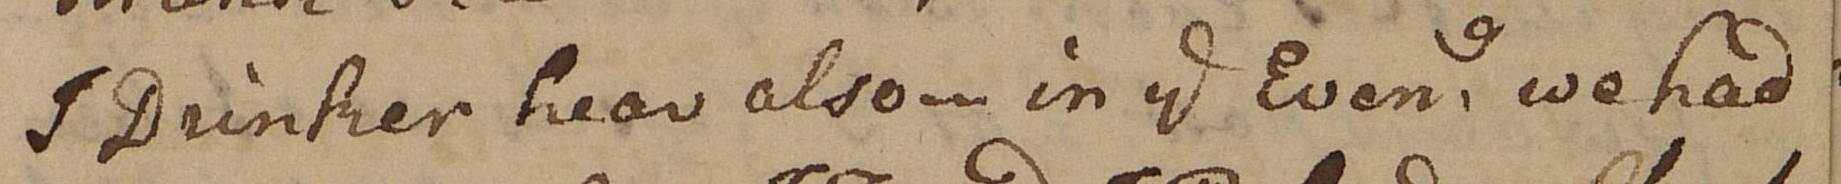J Drinker hear also-- in y^e Even^g. we had
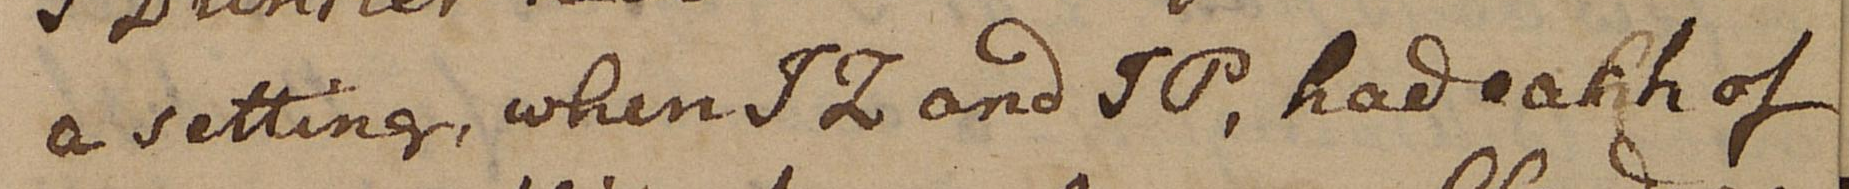a setting, when IL and JP. had each of
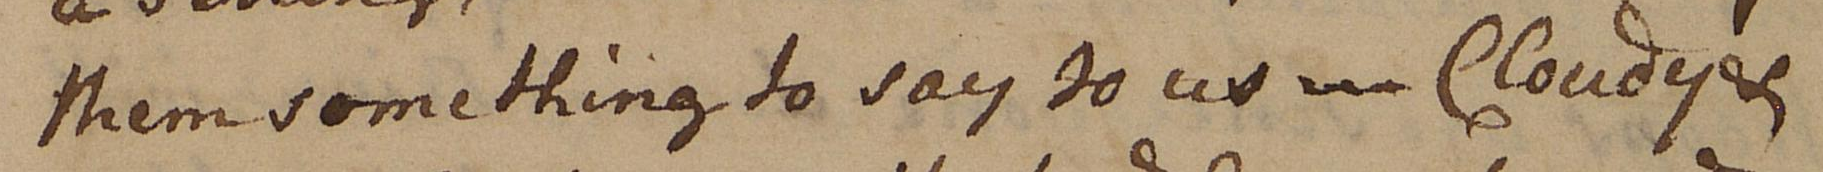them something to say do us- Cloudy &
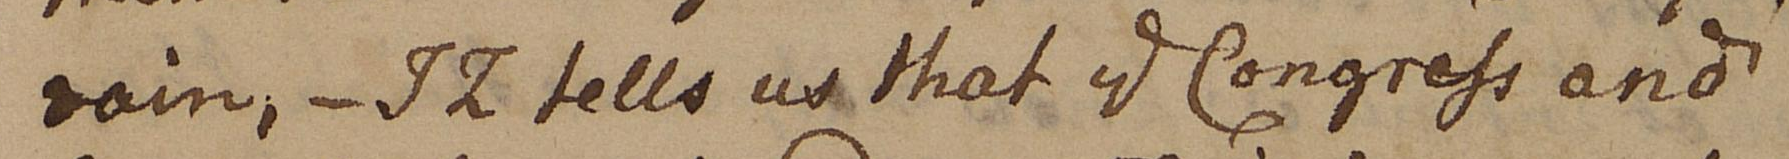rain,- IL tells us that y^e Congress and
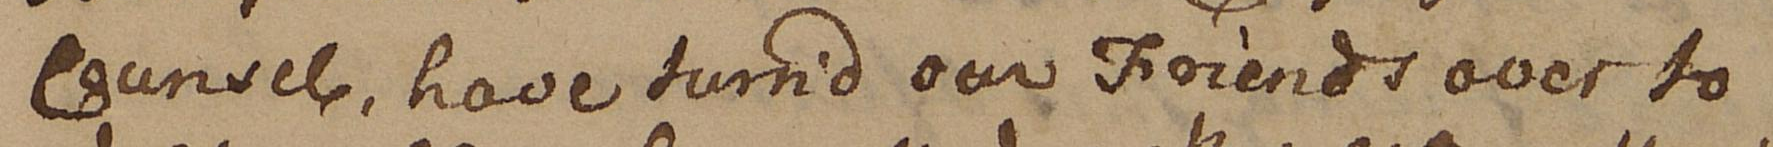Counsel, have turn'd our Friends over to
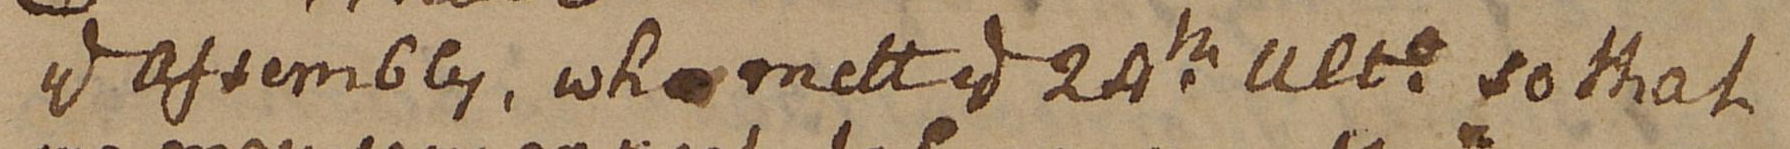y^e assembly, who mett y^e 29^th. Ult^o so that
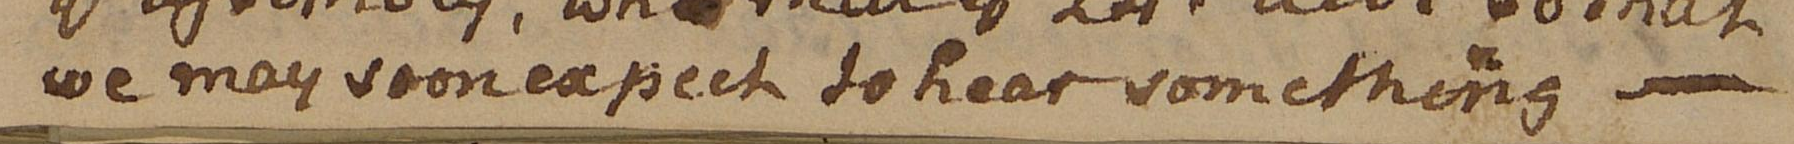we may soon expect to hear something-
